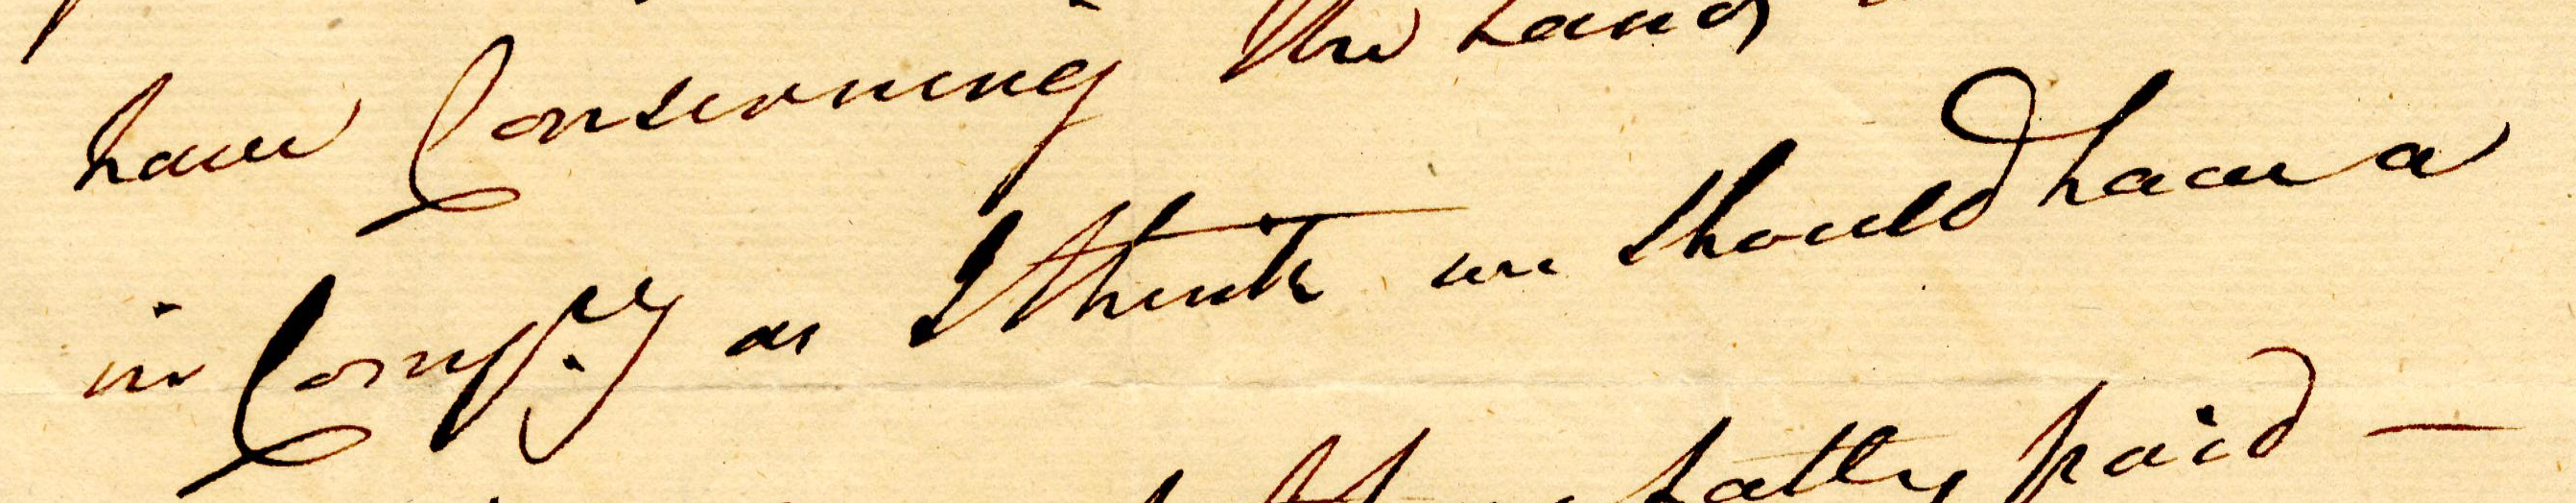in Comp^y. as I think we should have a
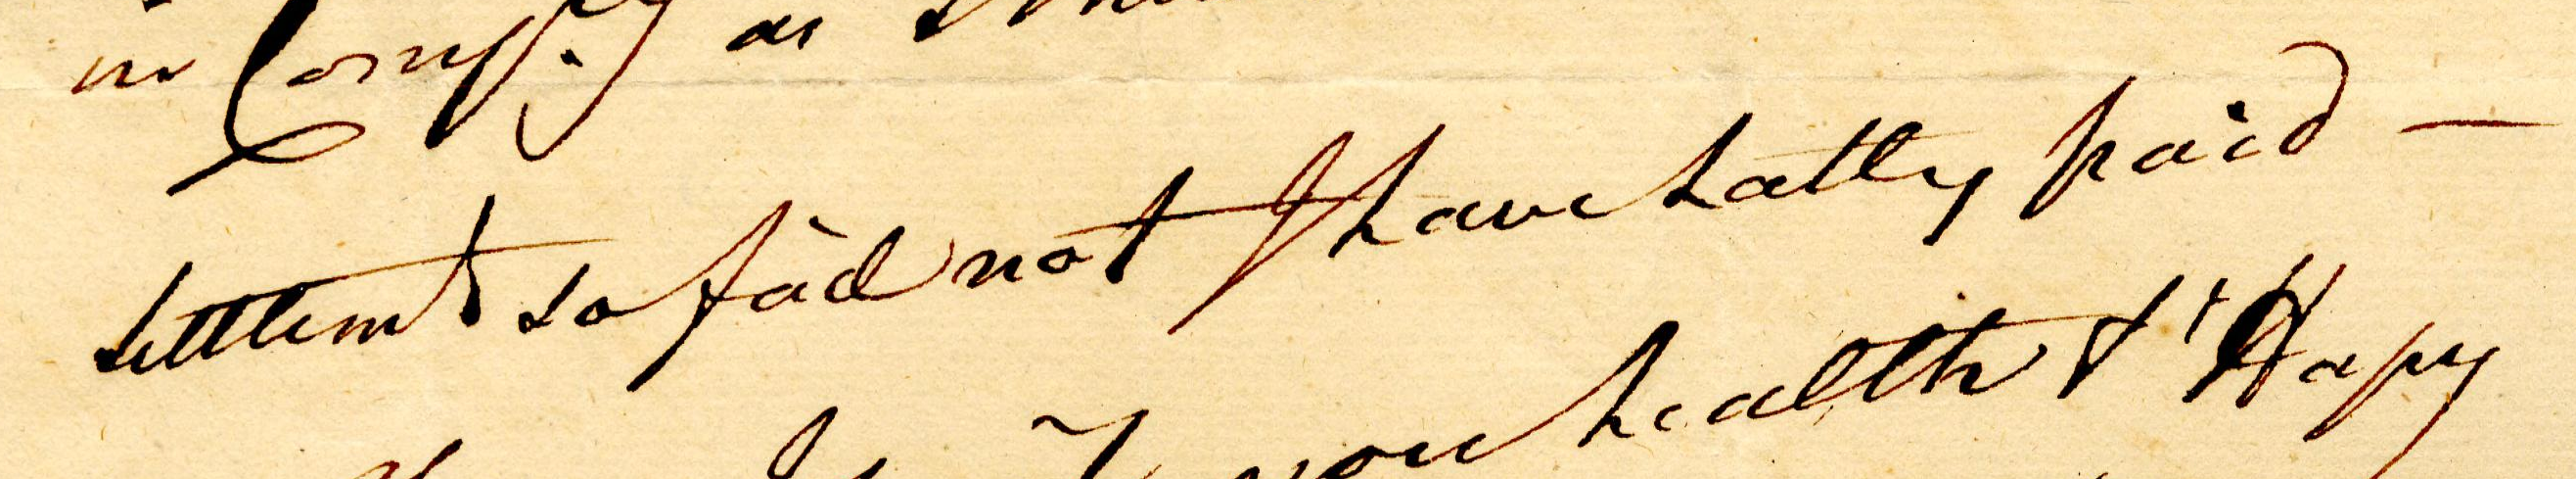settlem^ts so said not I have Latly paid.-
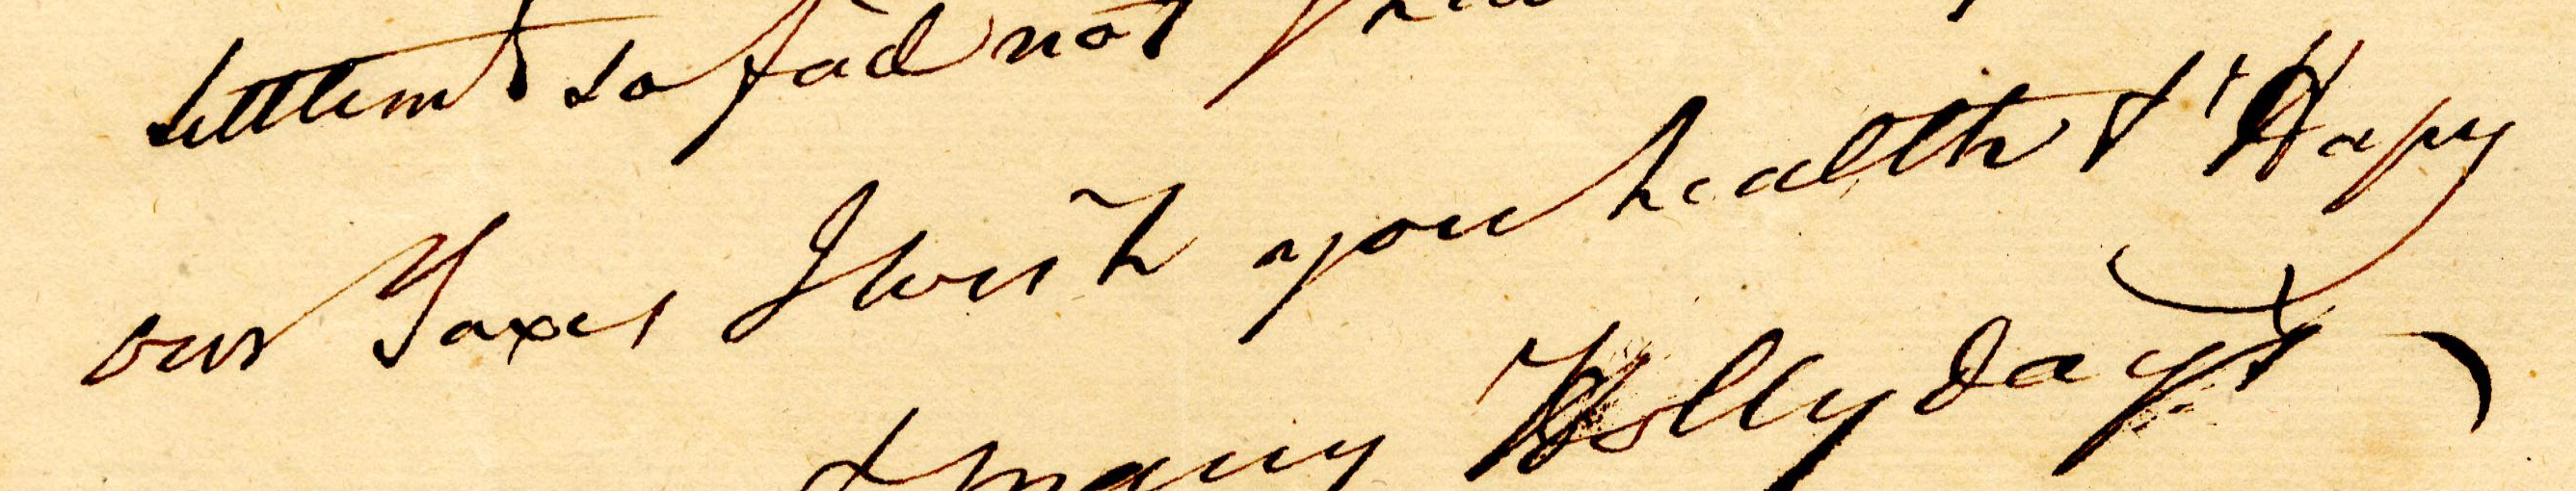our Taxes I wish you health & Hapy
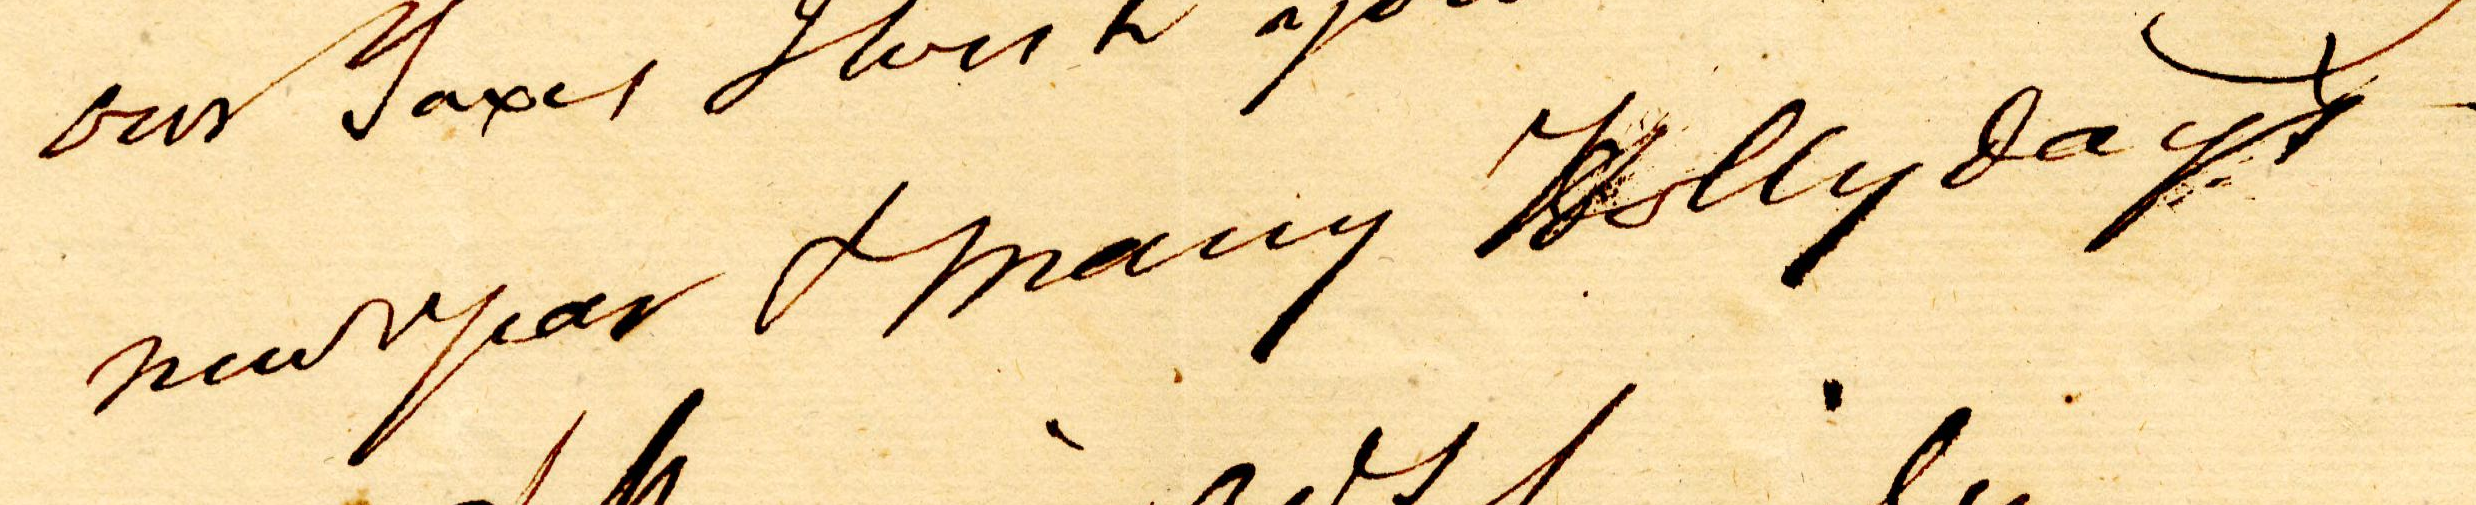new year & many Holly days
